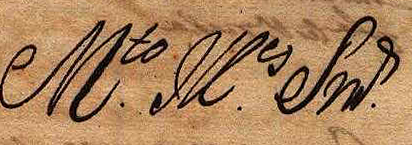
M.to Ill.es Snr.es
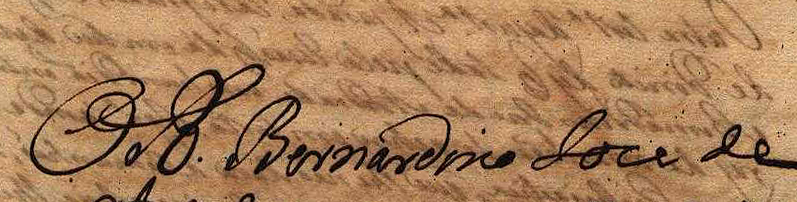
O P. Bernardino Ioze de
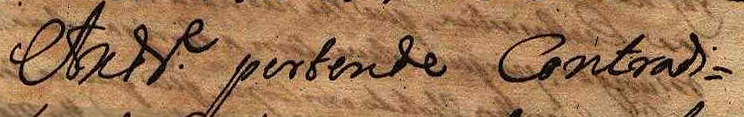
Andr.e pertende Contradi
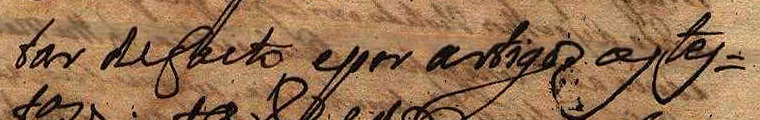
tar de facto, e por artigos as tes
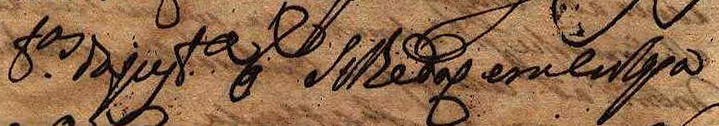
t.as da just.a q̄ selhedaꝭ em culpa
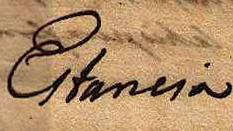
Estancia
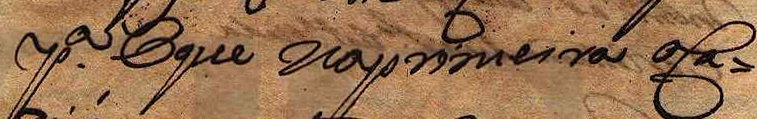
p.a O que na primeira oCa
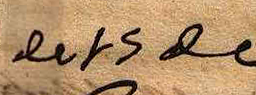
de 15 de
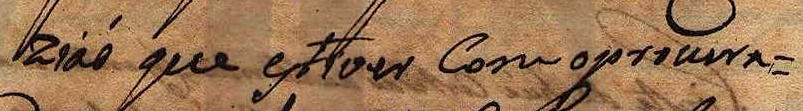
ziaõ que estiver Com o procura
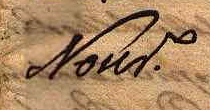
Nour.o
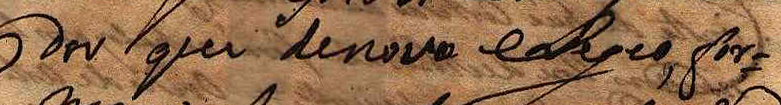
dor que de novo eLegeo, for
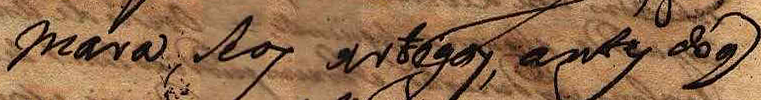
mara seos artigos, antes do q̄
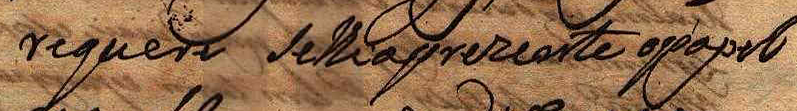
requere selheaprezente o papel
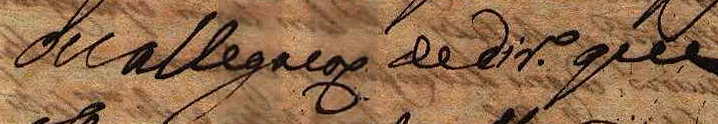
ou allegaçaꝭ. de dir.to que
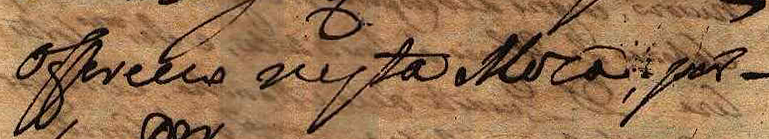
offereceo nesta Meza; por
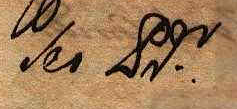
seo Pr.or
